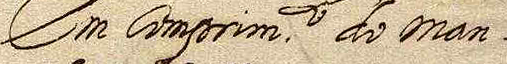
Em comprim.to do man
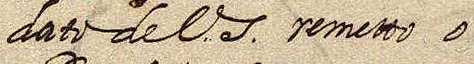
dato de V. S. remetto o
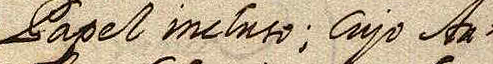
Papel incluso; cujo Au
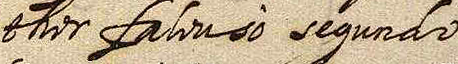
thor falou sò segundo
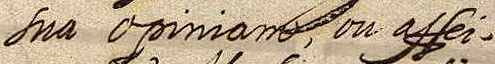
sua opiniam, ou affei-
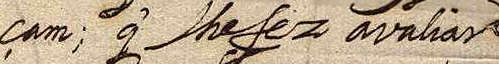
çam; q̄ lhe fez avaliar
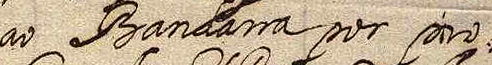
ao Bandarra por pro
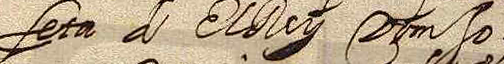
feta d' El Rey Dom Jo
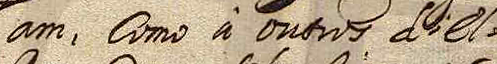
am, como à outros d'El
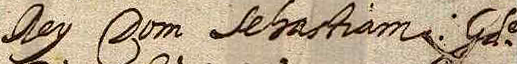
Rey Dom Sebastiam: Gd.e
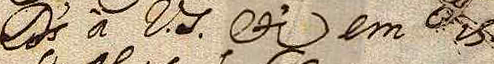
Ds̄ à V. S. &c em 15.
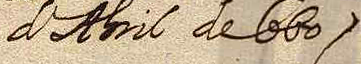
d'Abril de 660 /
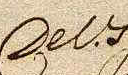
De V. S.
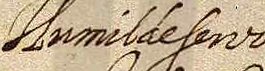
Humilde Servo
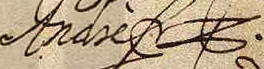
Andrè Frz̄.
